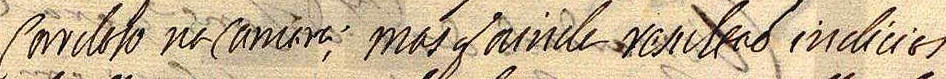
Cardoso na camara; mas q̄ ainda resultaõ indicios
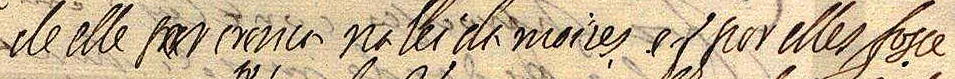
de elle ter crença na lei de moises, e q̄ por elles fosse
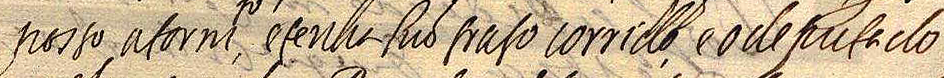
posto a torm.to e tenha hū trato corrido, e o deputado
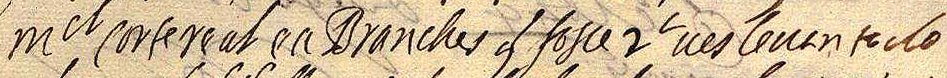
mel cortereal e aBranches q̄ fosse 2a ues leuantado
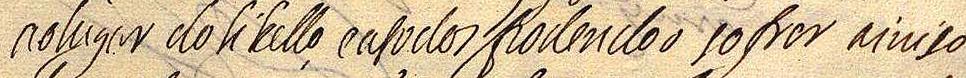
ao lugar do libello, e a todos podendoo sofrer a iuizo
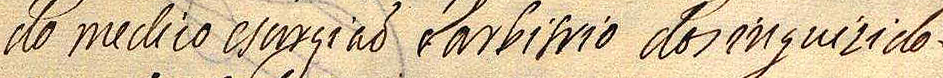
do medico e surgiaõ e arbitrio dos inquizido
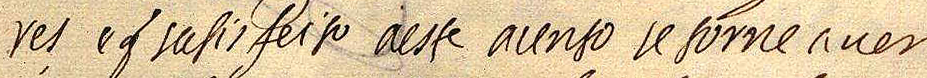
res, e q̄ satisfeito a este acento se torne a uer
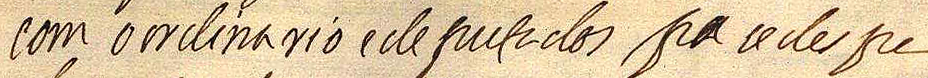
com o ordinario e deputados pa se despa
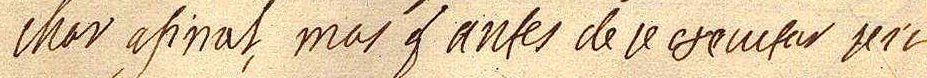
char a final, mas q̄ antes de se executar seia
